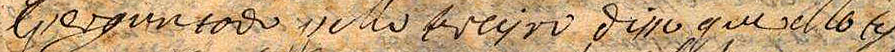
E perguntado pello tercejro disse que elle tes
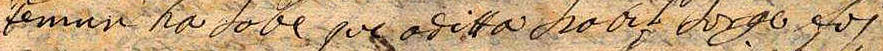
temunha sabe que a ditta Izabel Iorge foi
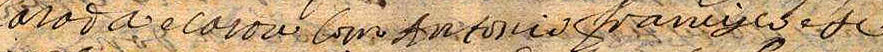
cazada e cazou com Antonio francisco e se
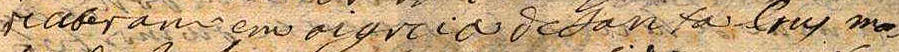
receberam em a igreia de santa Crus ma
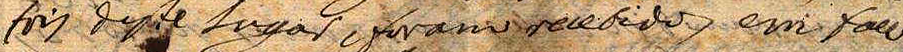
tris deste Lugar e foram recebidos em face
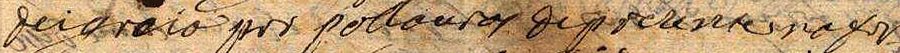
de igreia por pallauras de prezente na for
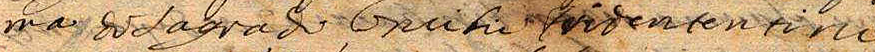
ma do sagrado Concilio tridententino
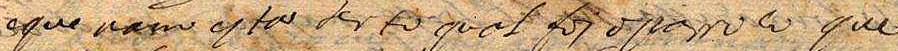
e que nam esta serto qual foi o parroco que
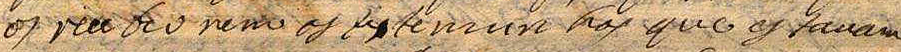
os recebeo nem as testemunhas que estauam
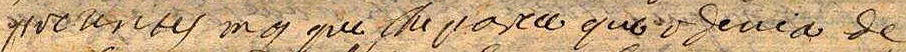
prezentes mas que lhe parece que o deuia de
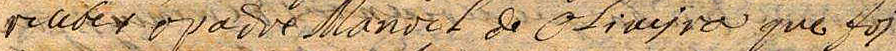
receber o padre Manoel de Oliueira que foi
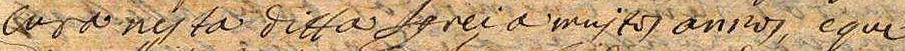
cura nesta ditta Igreia a muitos annos, e que
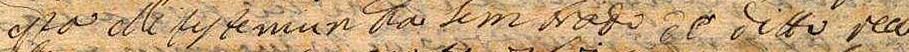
esta elle testemunha lembrado do ditto rece
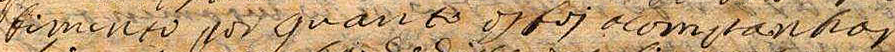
bimento por quanto os foi acompanhar
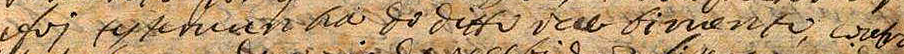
e foi testemunha do ditto recebimento, e outro
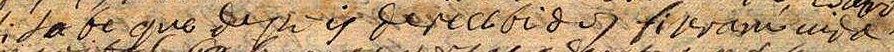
si sabe que depois de recebidos tiveram uida
